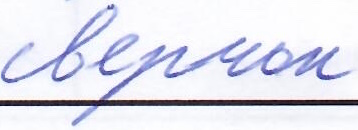сверчок
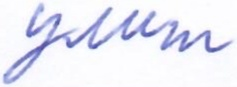улит
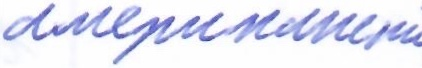амерыикански
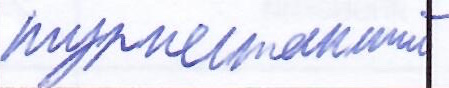туркестанский
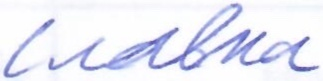славка
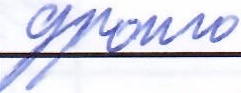дронго
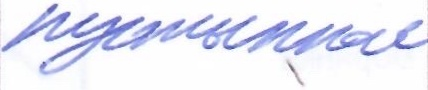пустынная
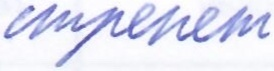стрепет
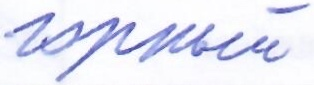горный
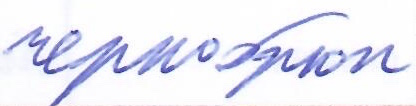чернобрюх
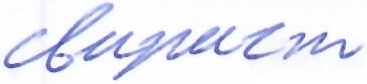свирист
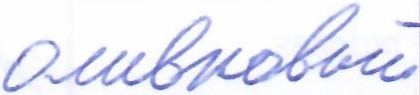оливковый
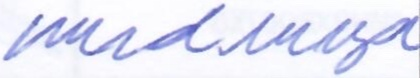пигалица
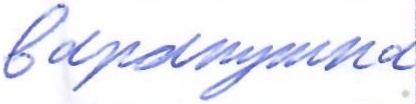варакушка
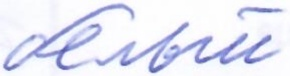белый
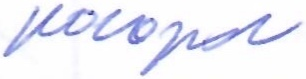носорог
